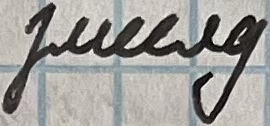змееяд
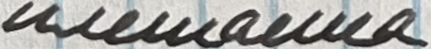плешанка
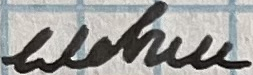еловик
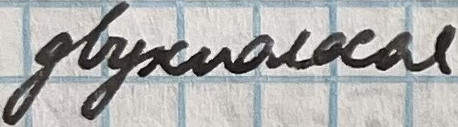двухполосая
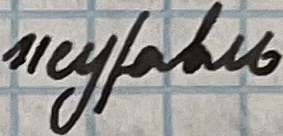журавль
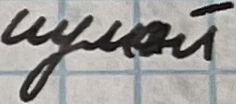кумай
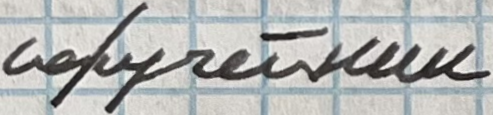поручейник
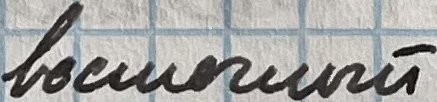восточный
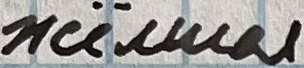жёлтая
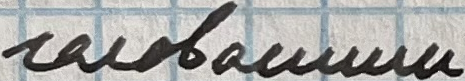головастик
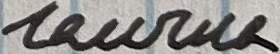гаичка
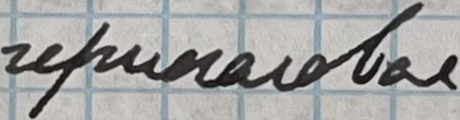черноголовая
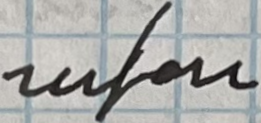чирок
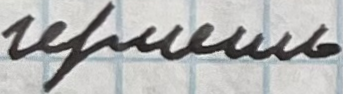чернеть
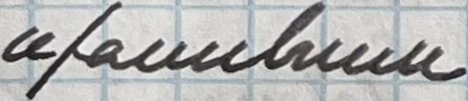крапивник
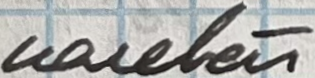полевой
